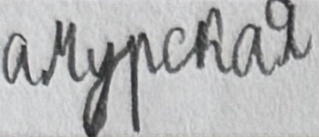амурская
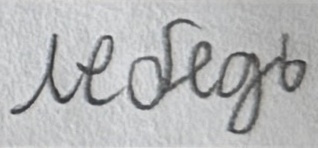лебедь
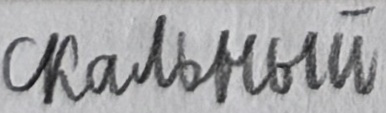скальный
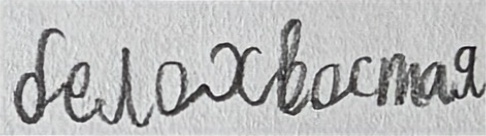белохвостая
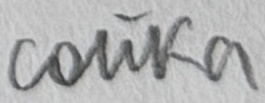сойка
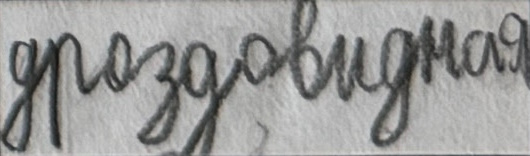дроздовидная
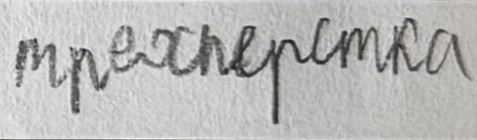трехперстка
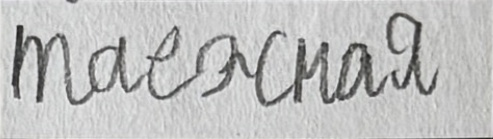таежная
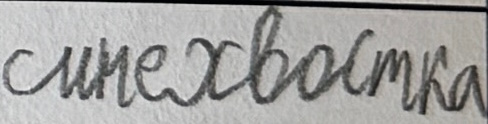синехвостка
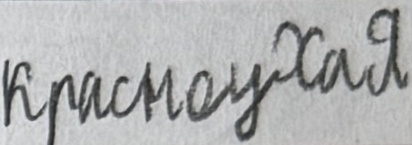красноухая
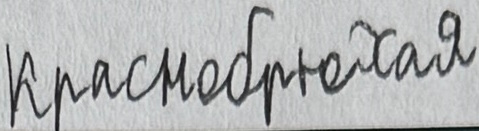краснобрюхая
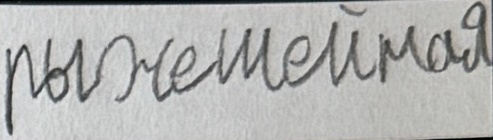рыжешейная
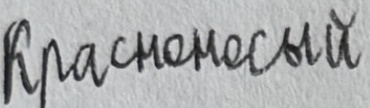красноносый
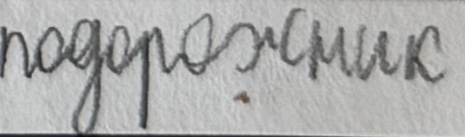подорожник
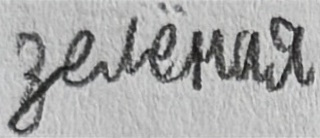зелёная
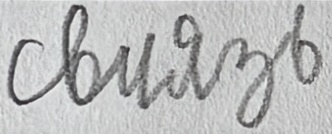свиязь
